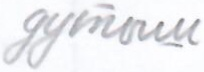дутыш
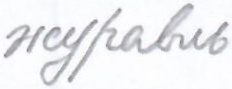журавль
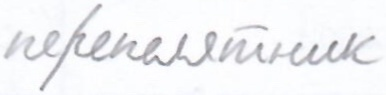перепелятник
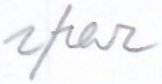грач
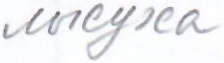лысуха
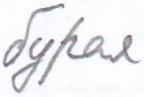бурая
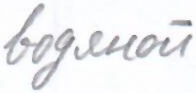водяной
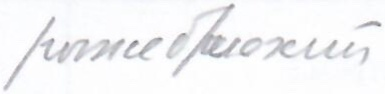рыжебрюхий
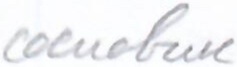сосновик
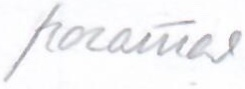рогатая
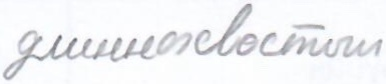длиннохвостый
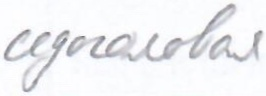седоголовая
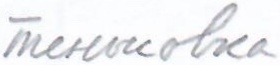теньковка
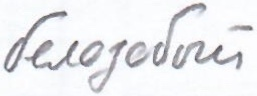белозобый
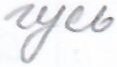гусь
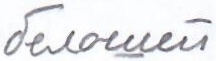белошей
